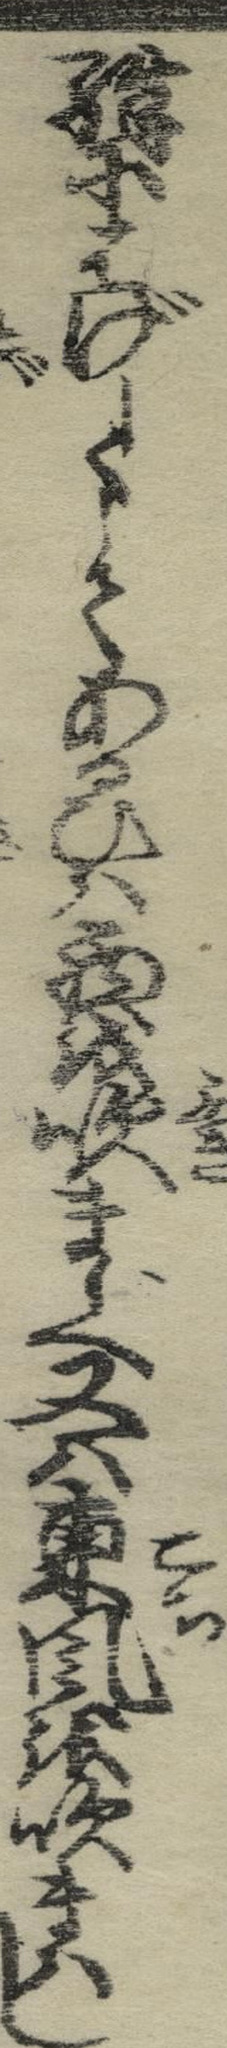殊にはげしくてあるひは西を吹まじへ又は東風を吹まはし
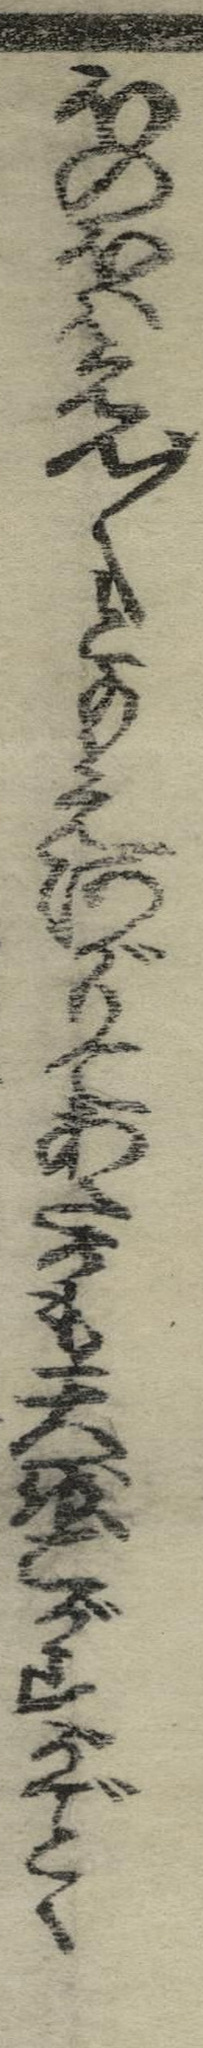ほのほはえん〳〵ともえあがりてあたかも天をこがすがごとく
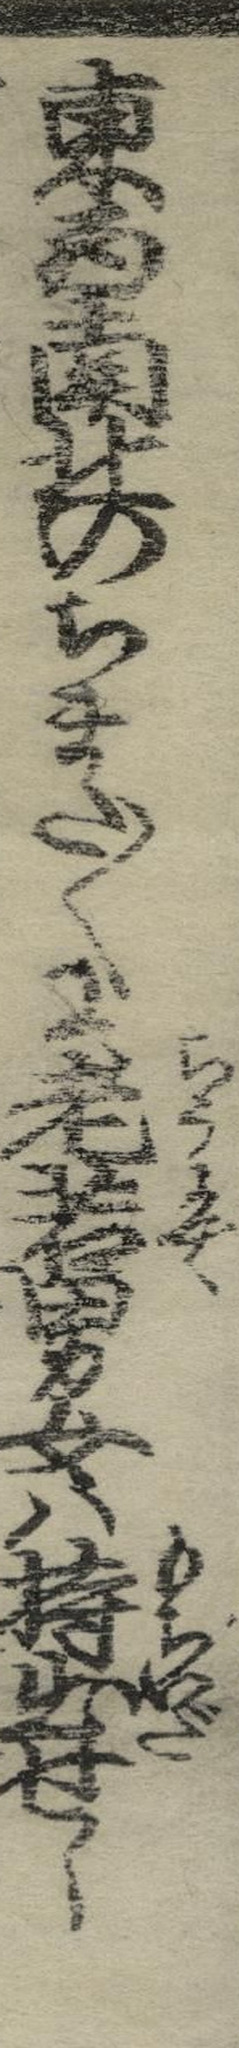東西南北のちまた〳〵に老若男女は持出せし
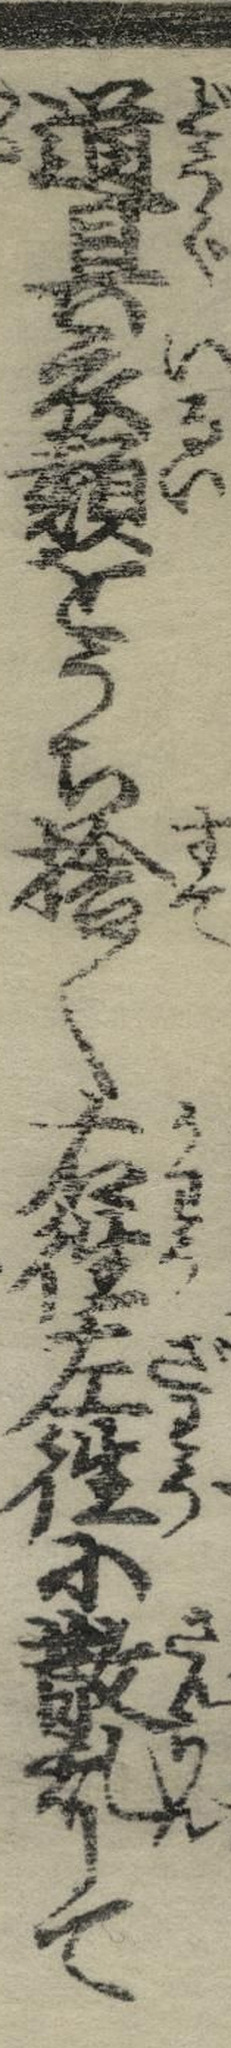道具衣類をうち捨〳〵右往左往に散乱して
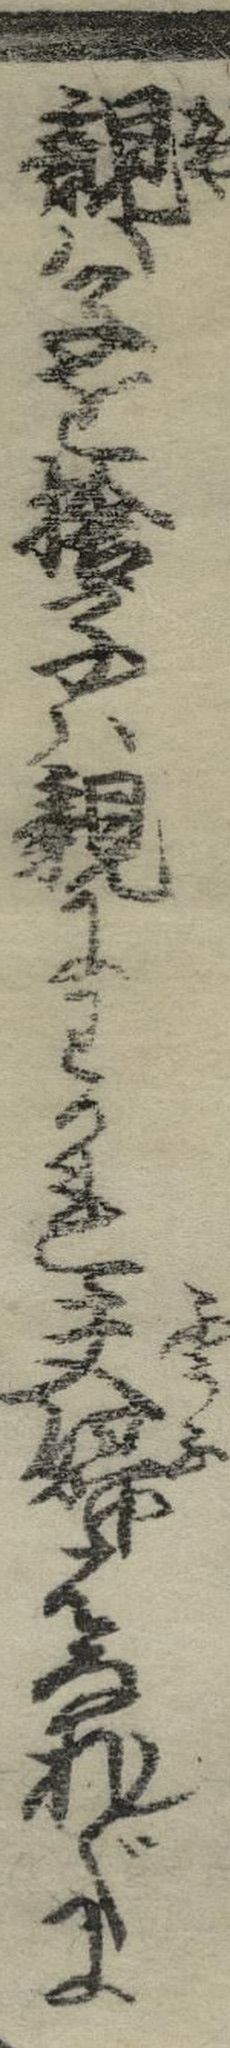親は子を捨子は親にわかれ夫婦はなれ〴〵に
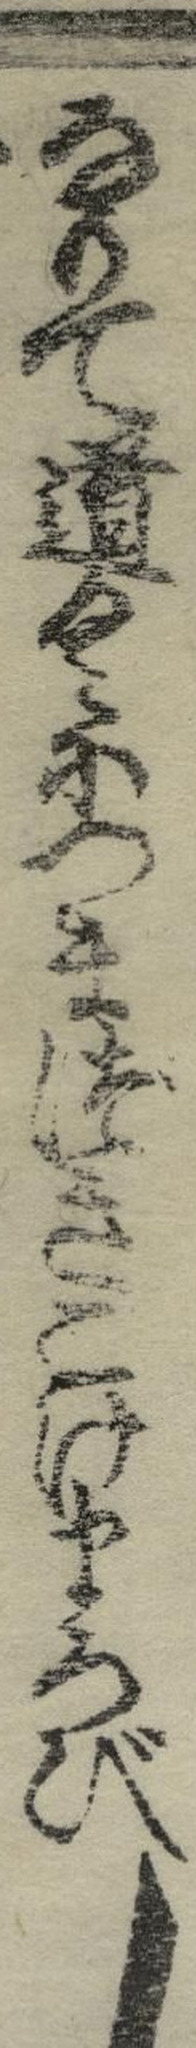なりて道具につまずきこけまろび
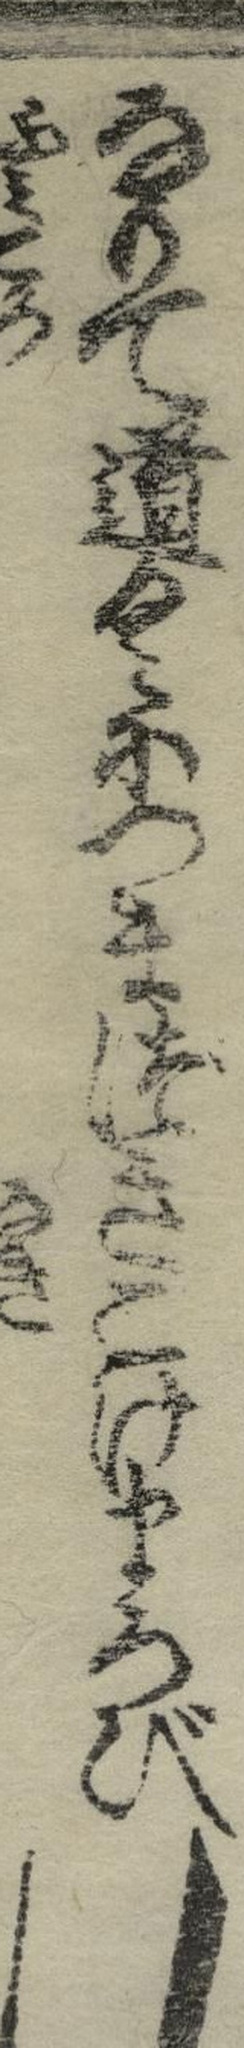なりて道具につまずきこけまろび
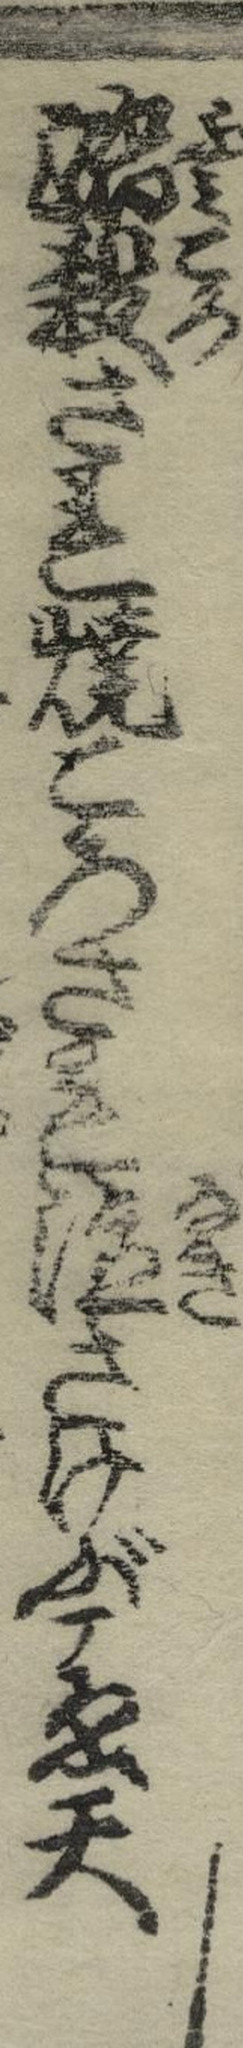踏殺され焼ころされ泣さけぶこゑ天
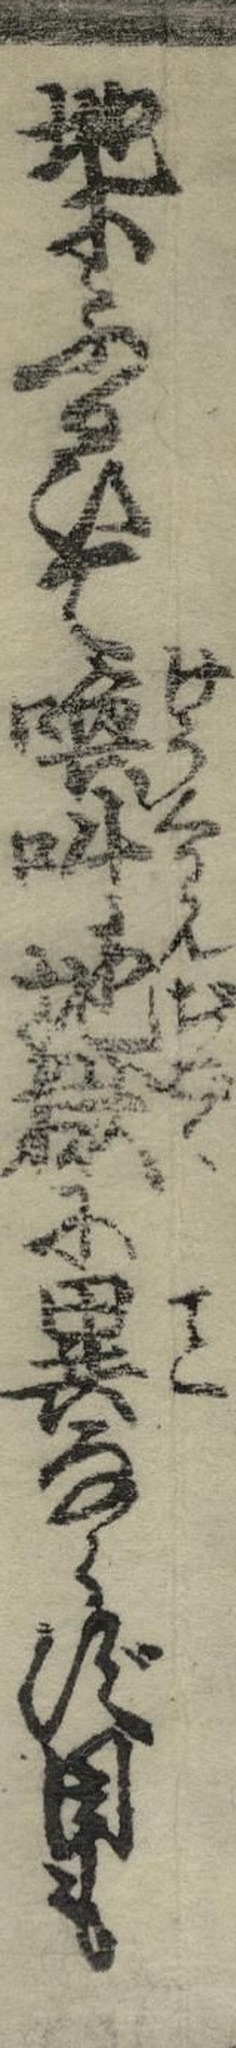地にふるひて喚叫地獄に異ならず目も
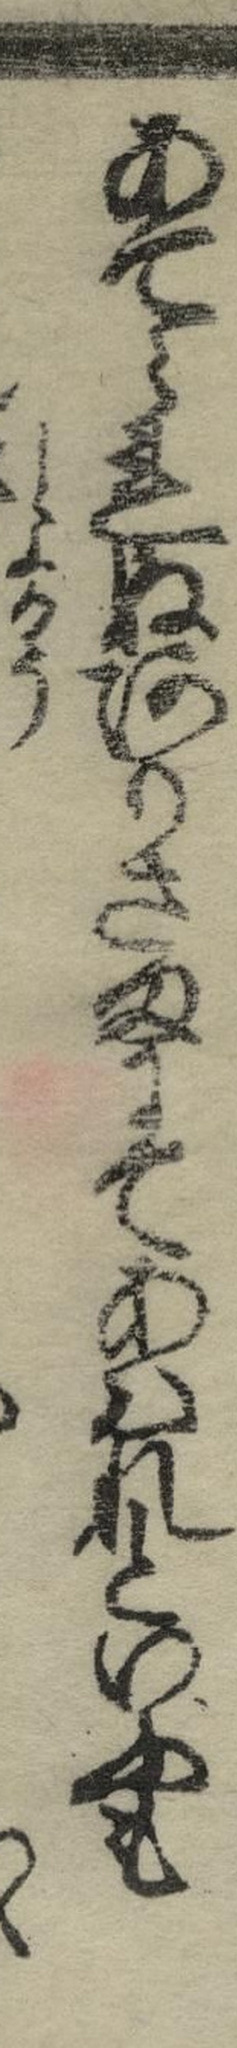あてられぬありさまにてあはれといふも
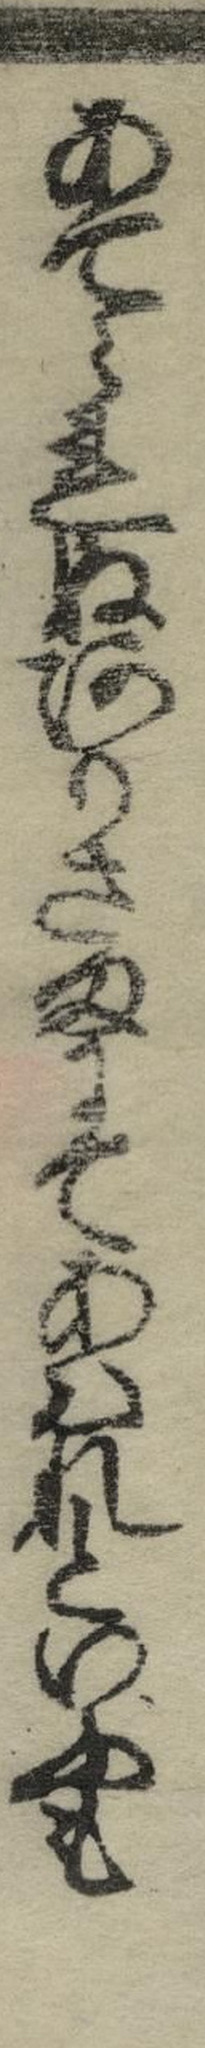あてられぬありさまにてあはれといふも
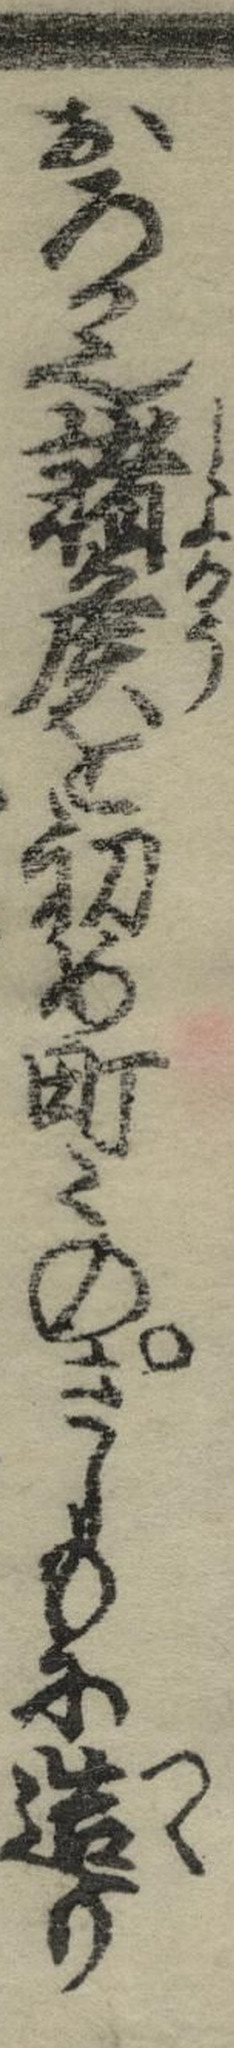おろか也諸矦を初め町々の。さしもに造り
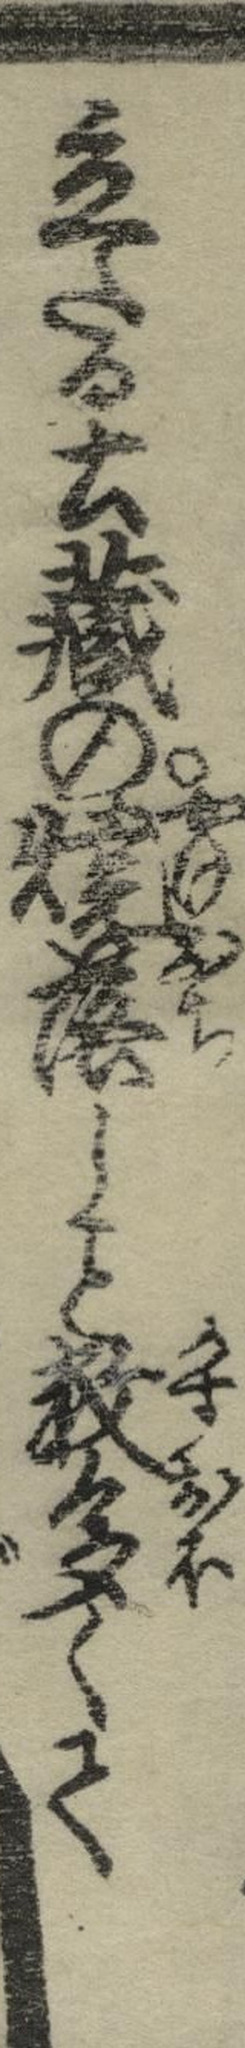立たる土蔵の焼落しこと数多くて
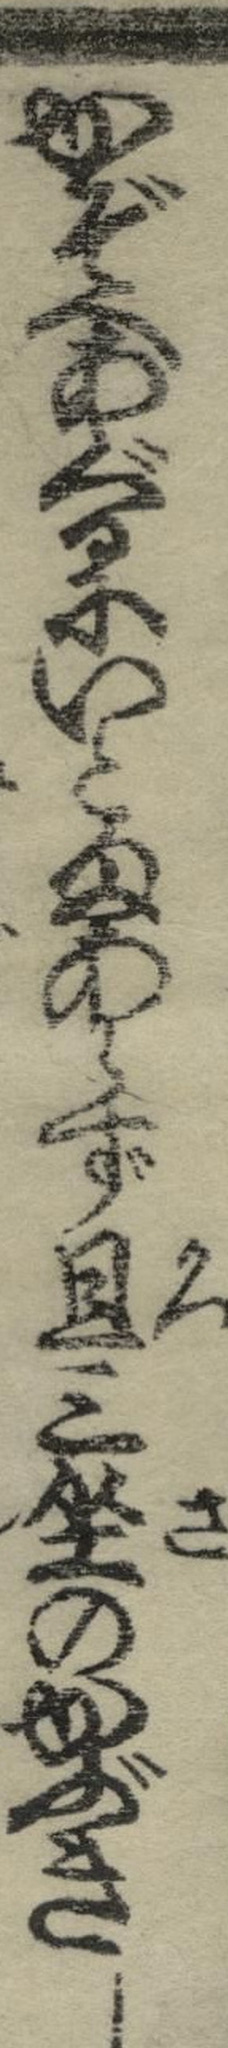かずへあぐるいとまあらず且三座のかぶき
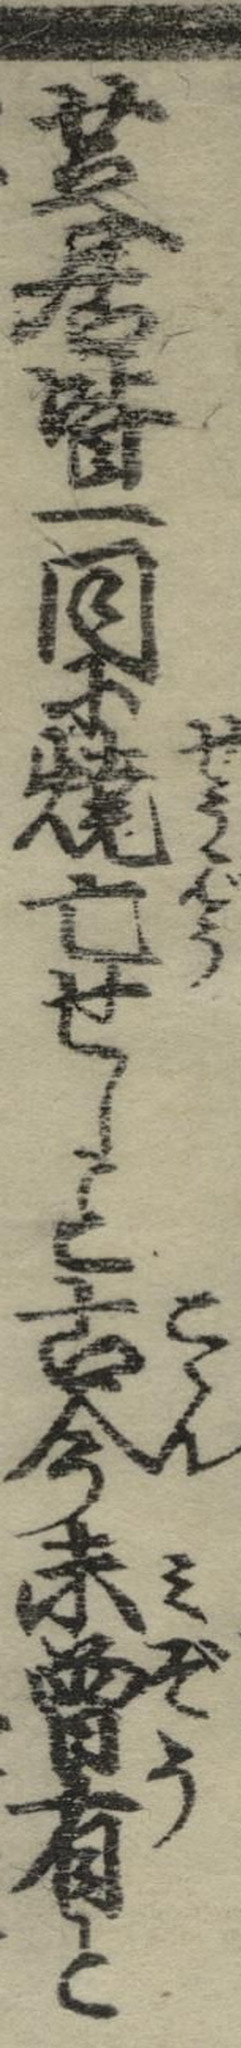芝居皆一同焼亡せしこと古今未曾有と
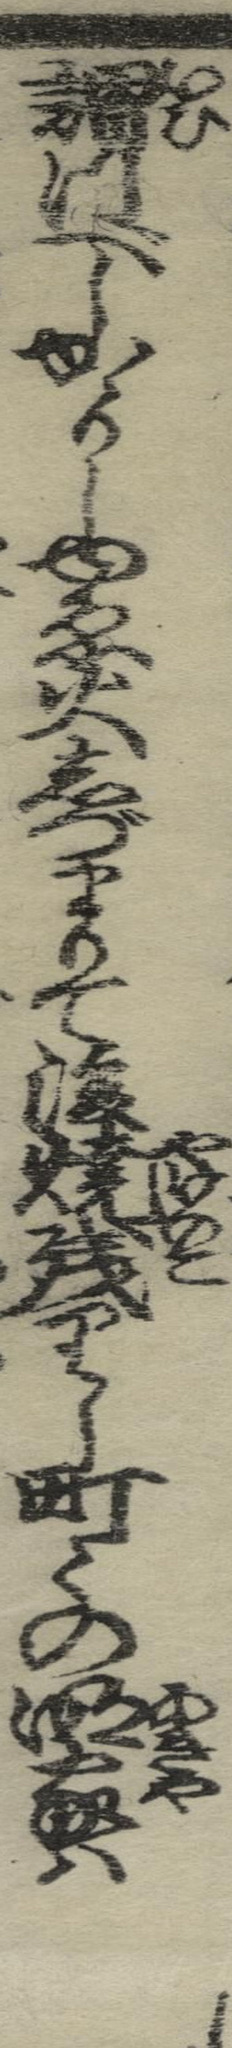謂つべしかゝりしゆゑ火しづまりて後焼残りし町々の明家は
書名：[文政十二年三月の江戸大火に関する瓦版]
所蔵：東京大学地震研究所図書室 Earthquake Research Institute Library, The University of Tokyo, JAPAN
